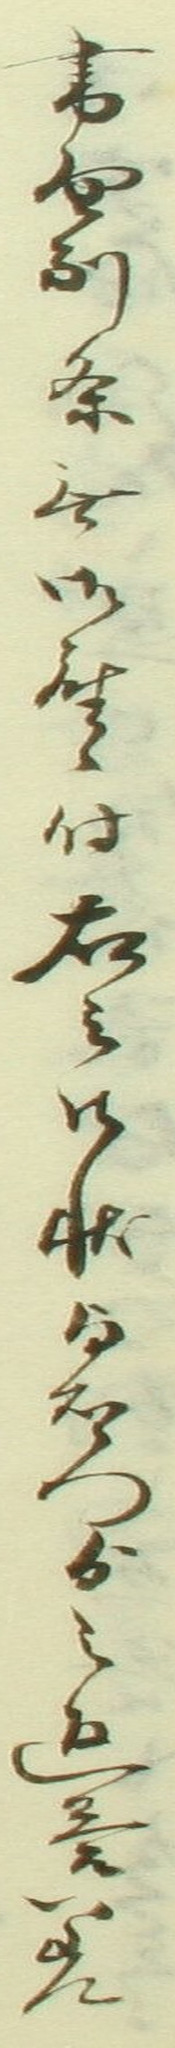書面別条無御座候付右之書状与右衛門より之返答差
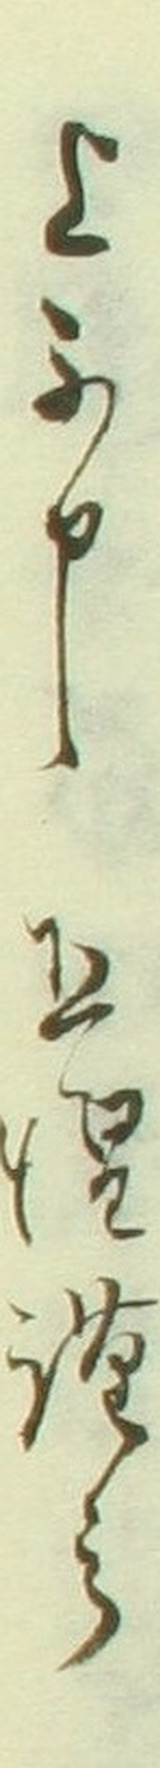上不申候恐惶謹言
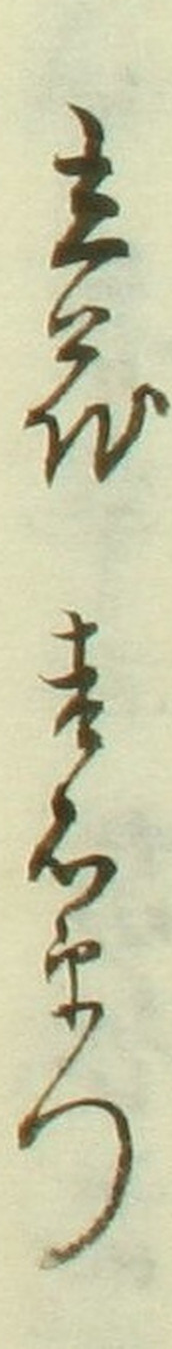立花吉右衛門
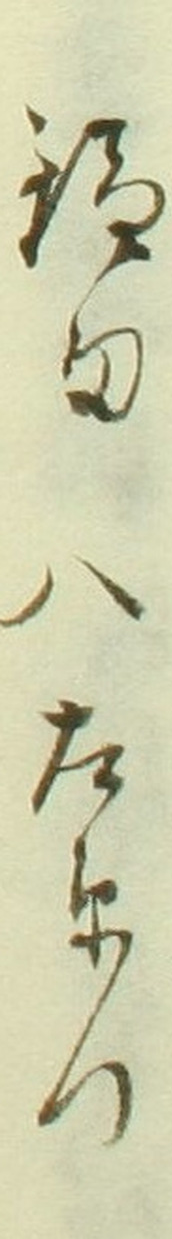鎌田八左衛門
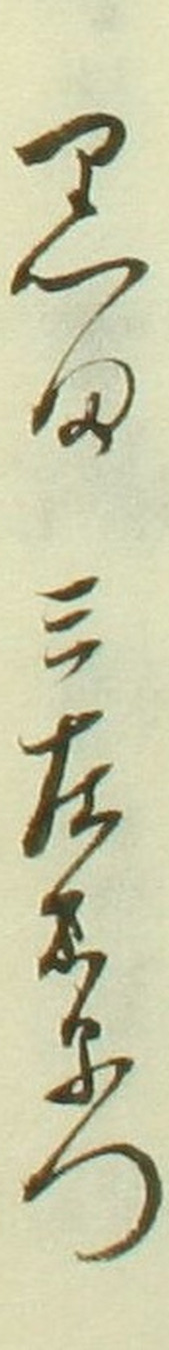黒田三左衛門
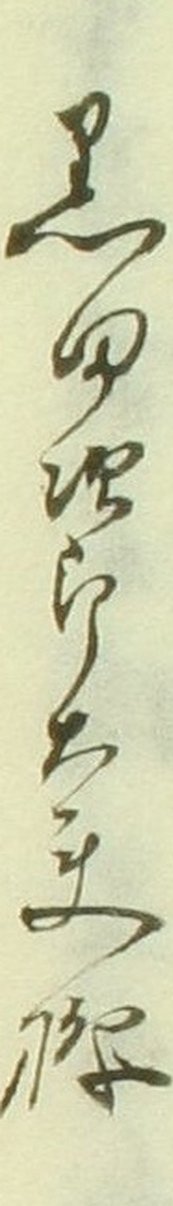黒田次郎大夫様
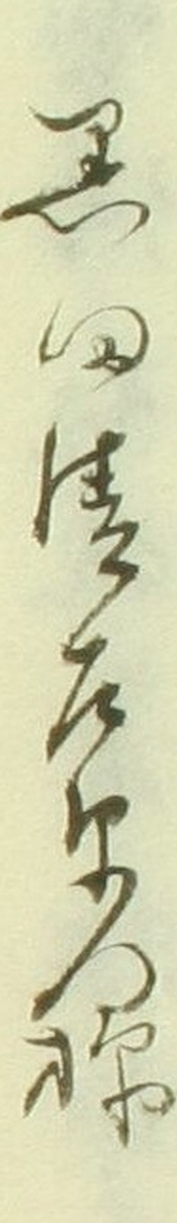黒田清左衛門様
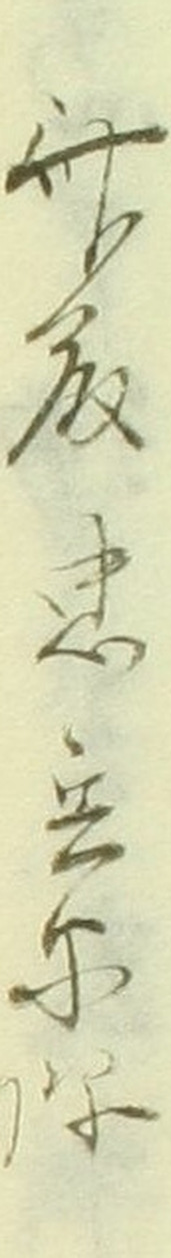斎藤忠兵衛様
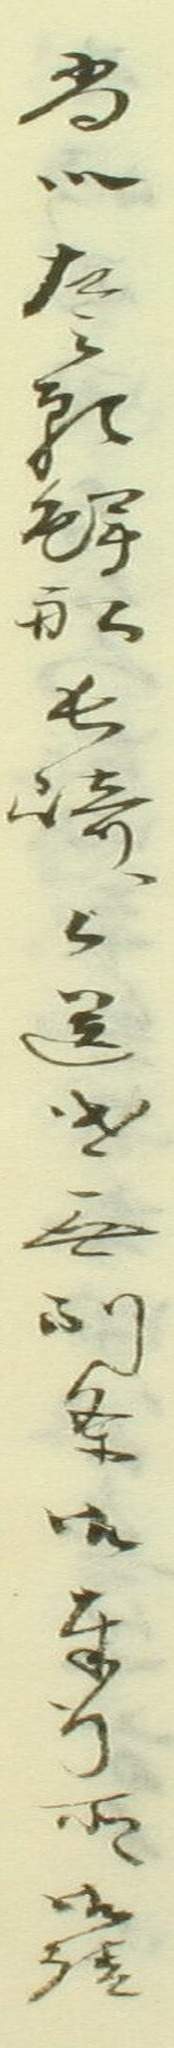尚以左之朝鮮船長崎へ被送遣無別条御奉行所へ御請
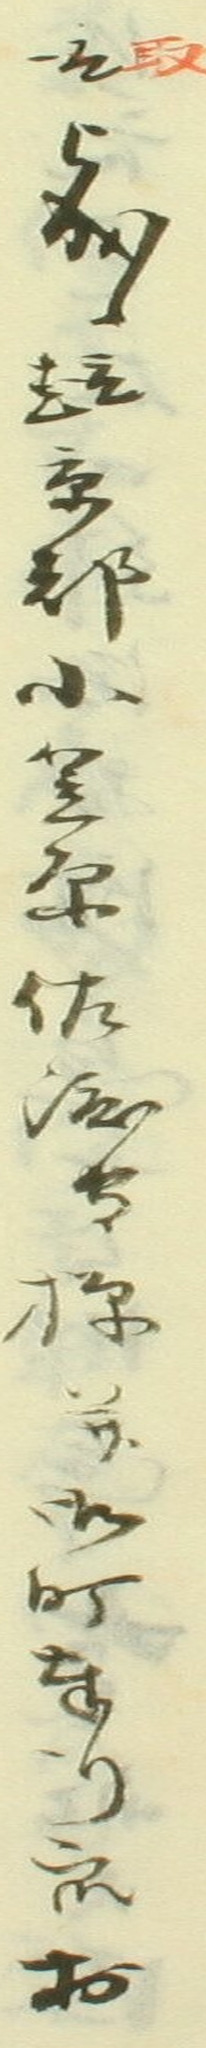取被成候候趣京都小笠原佐渡守様并御町奉行衆於
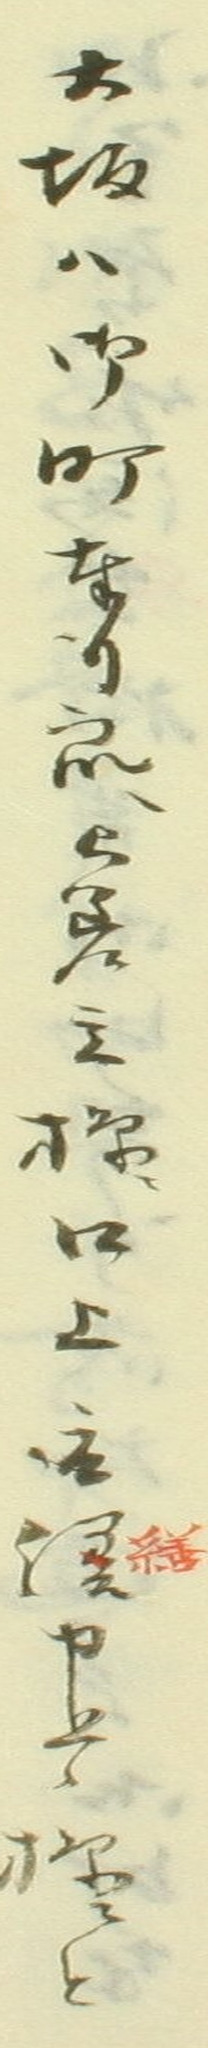大坂は御町奉行衆へ被差立様に口上取繕申上候様にと
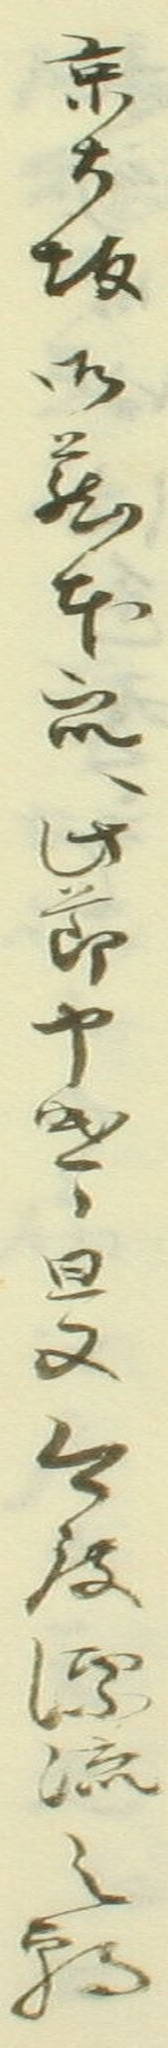京大坂御蔵本衆へ此節申遣候且又今度漂流之朝
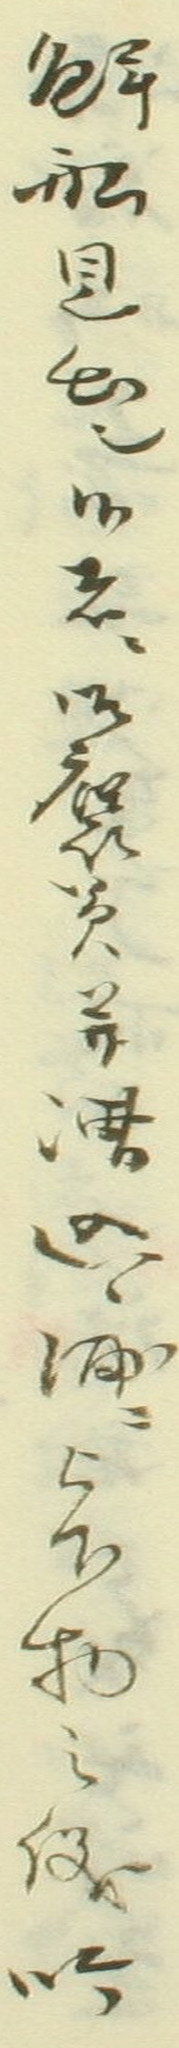鮮船見出し候者に御褒美并漕込候浦に被下物之儀吟
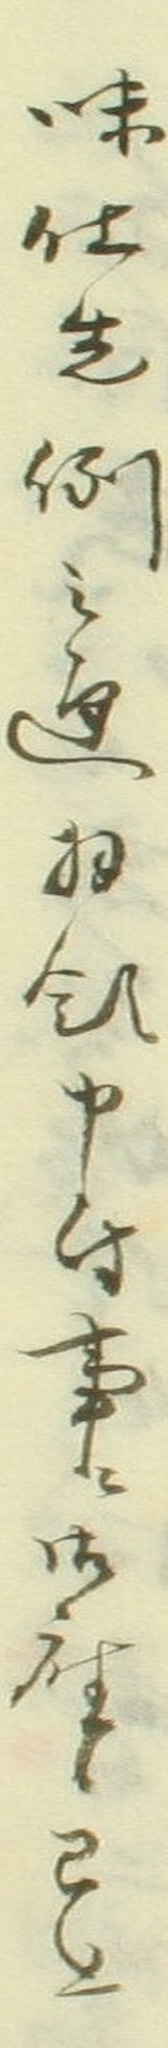味仕先例之通拝領可申付事に御座候已上
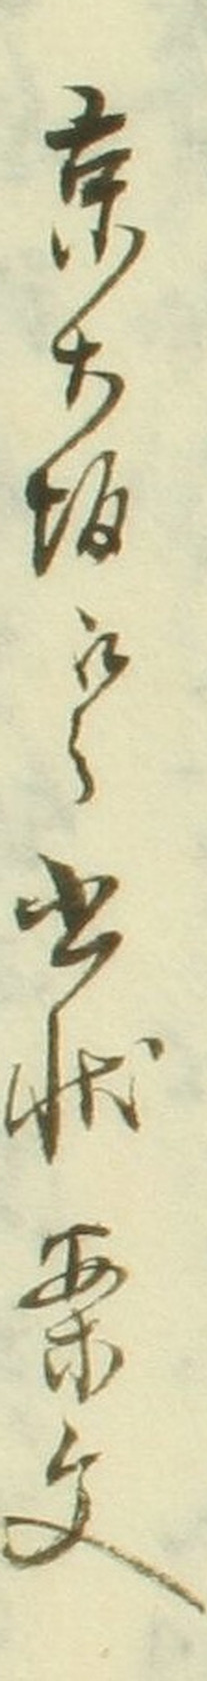京大坂え之書状案文
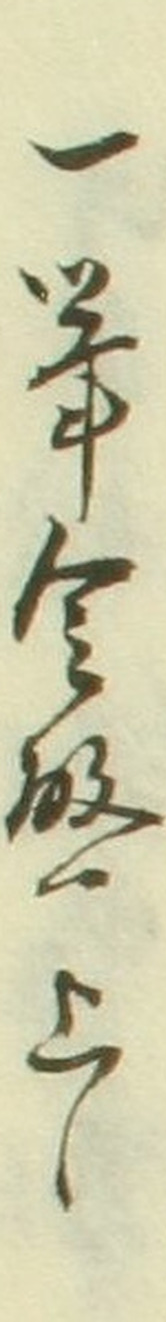一筆啓上候
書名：朝鮮船御領内漂流記 坤
